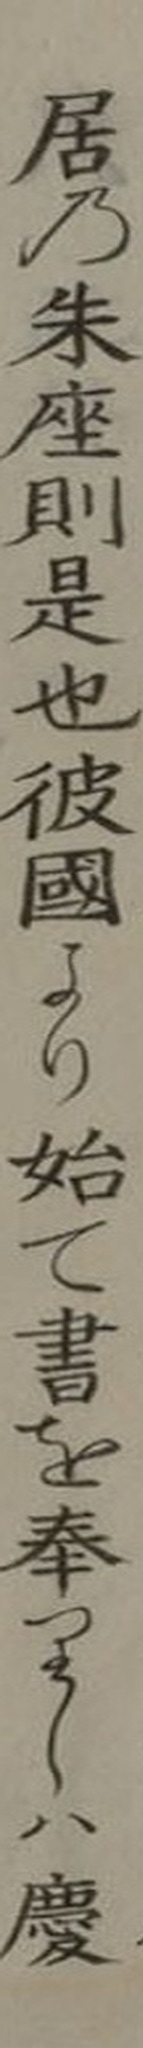居の朱座則是也彼國より始て書を奉りしは慶
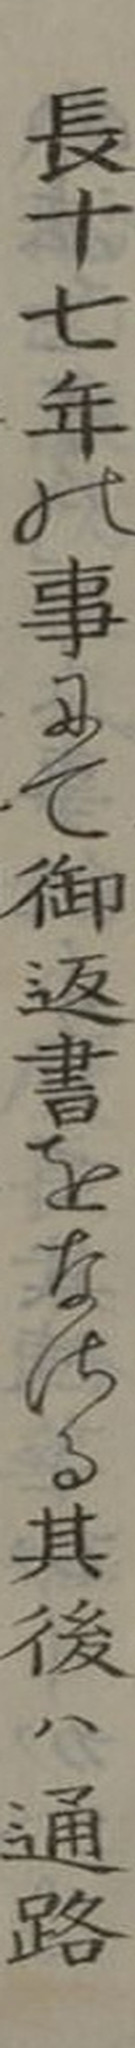長十七年の事にて御返書をなさる其後は通路
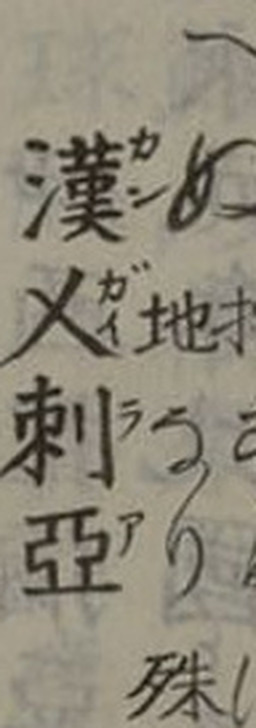漢乂刺亞
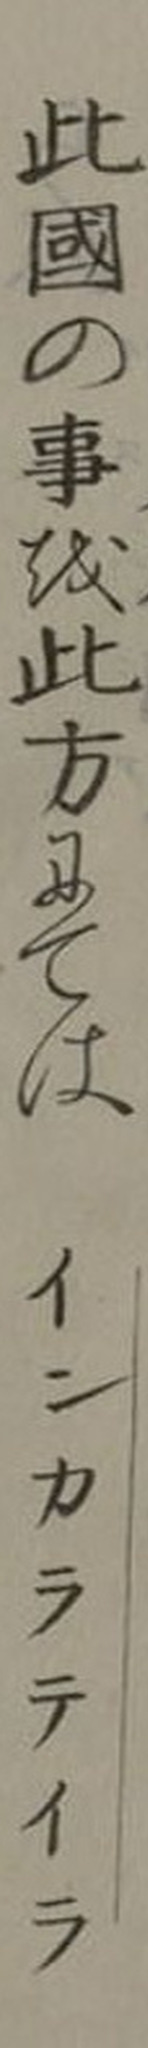此國の事を此方にてはインカラテイラ
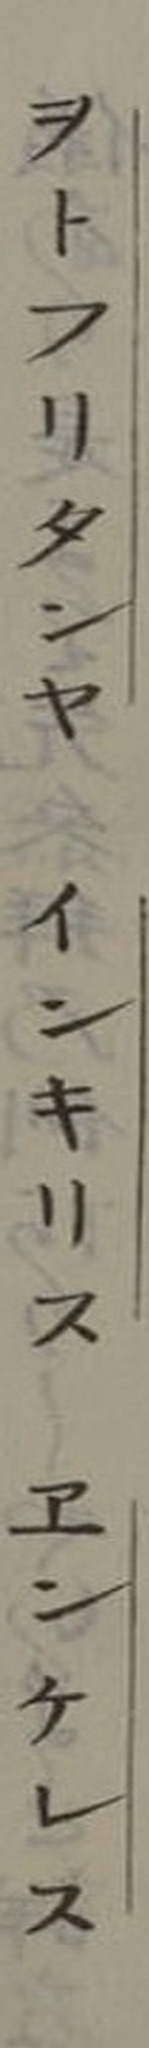ヲトフリタンヤインキリスエンケレス
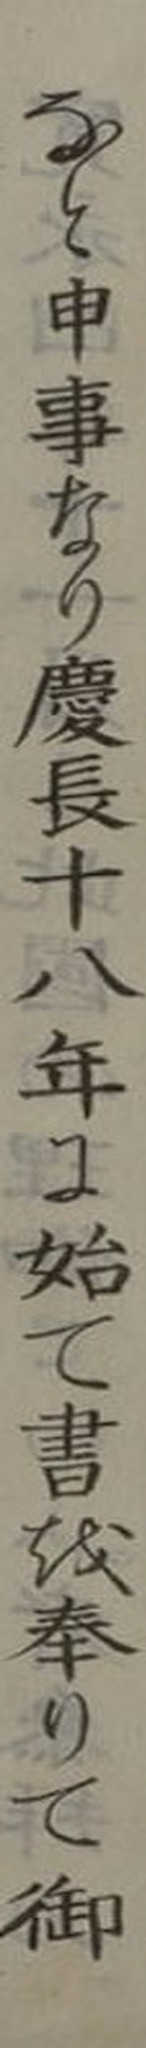ナト申事なリ慶長十八年に始て書を奉りて
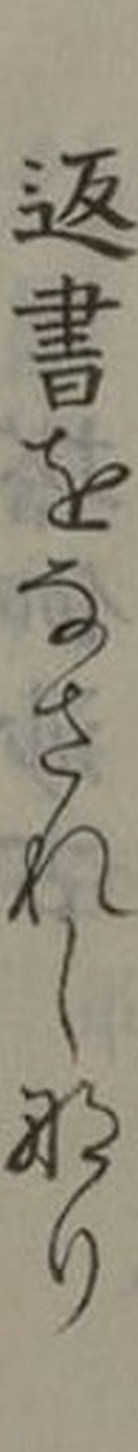返書をなされしなり

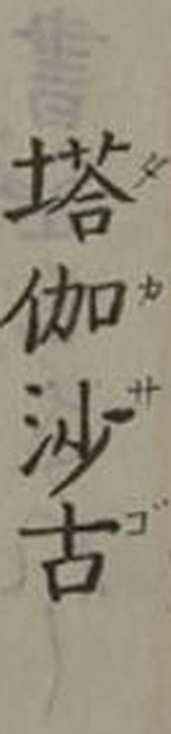塔伽沙古
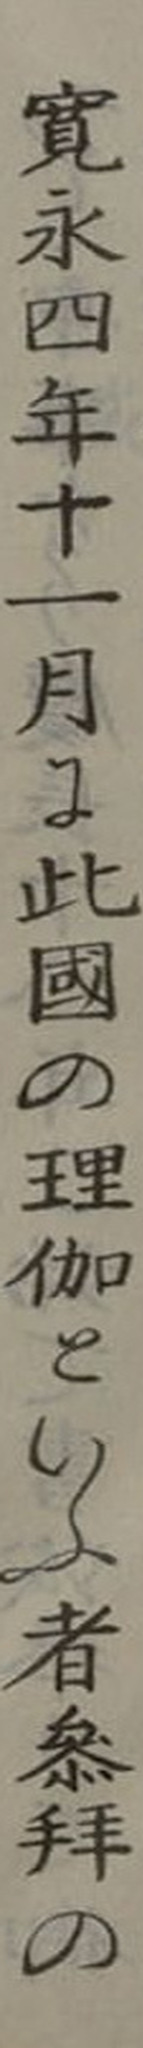寛永四年十一月に此國の理伽といふ者叅拜の
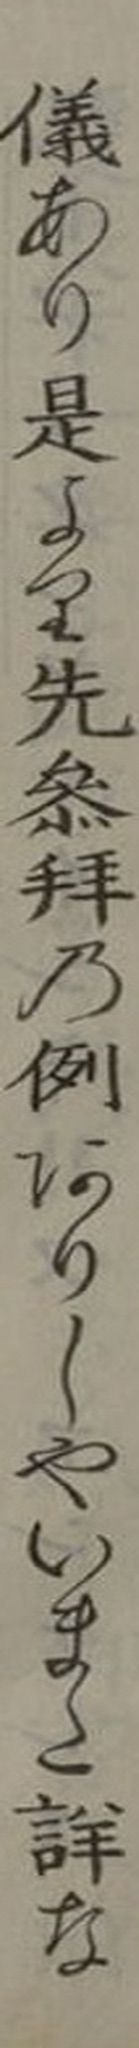儀あり是より先叅拜の例ありしやいまた詳な
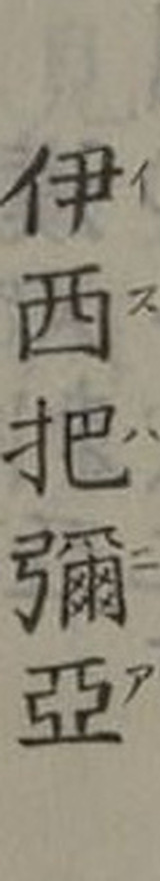伊西把彌亞
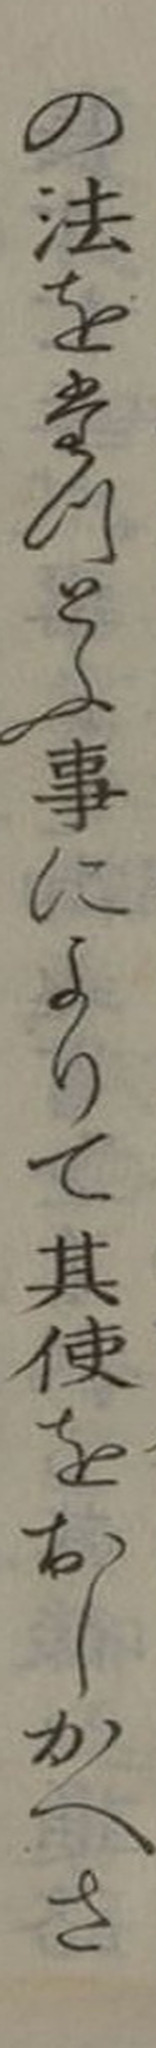の法をたつとふ事によりて其使をおしかへさ
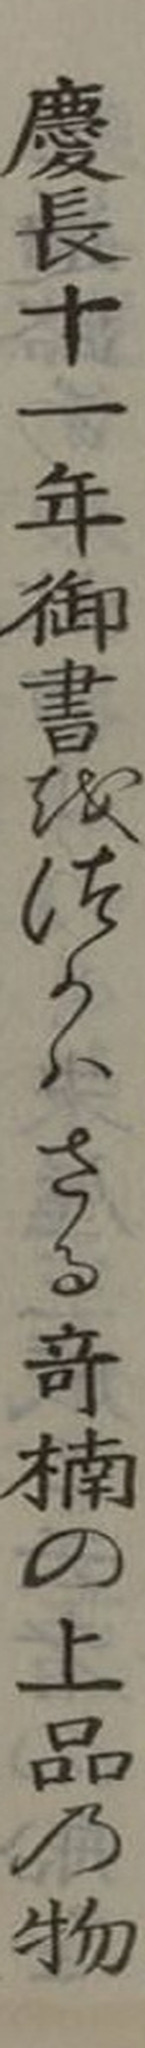慶長十一年御書をつかはさる竒楠の上品の物
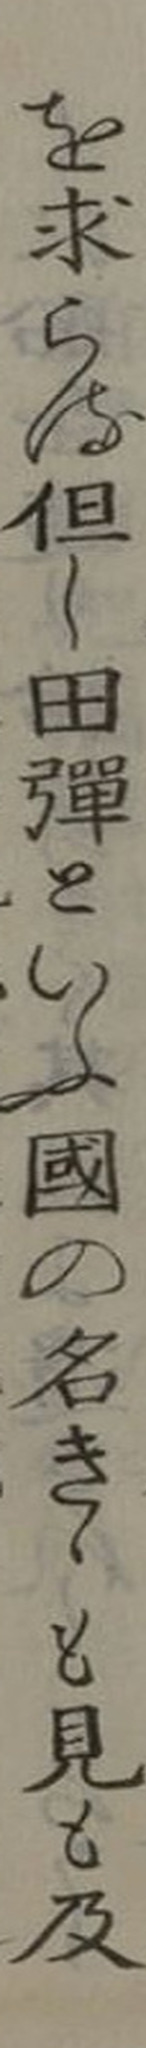を求らる但し田彈といふ國の名きゝも見も及
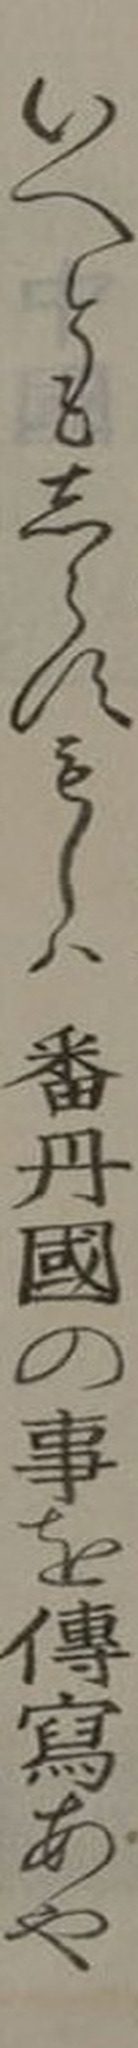いへともしらすもしは番丹國の事を傳寫あや
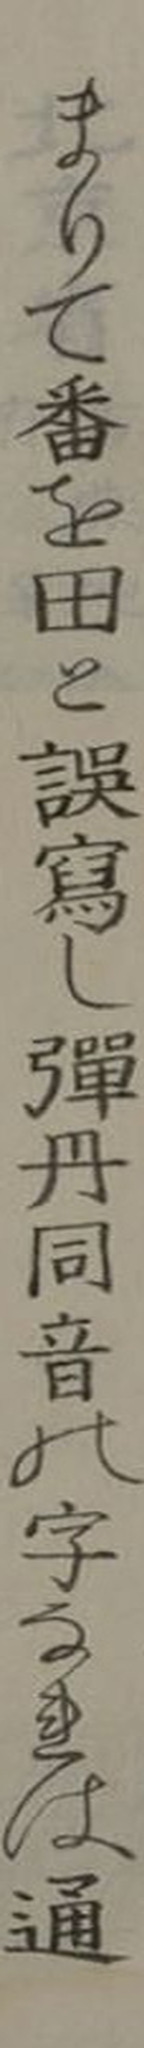まりて番と田と誤寫し彈丹同音の字なれは通
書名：骨董録
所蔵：University of the Ryukyus Library
